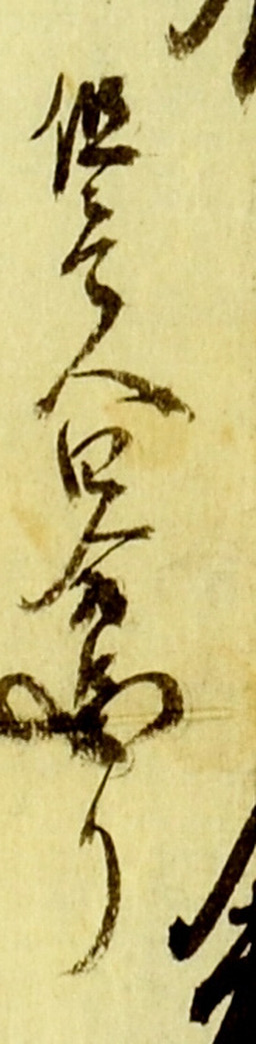但壱人四合図り
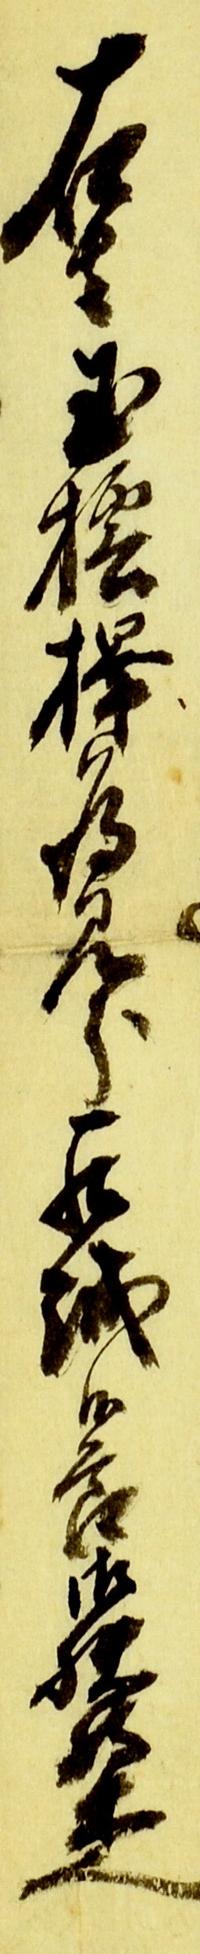右者玉橒襗為見分罷越候節御携者也
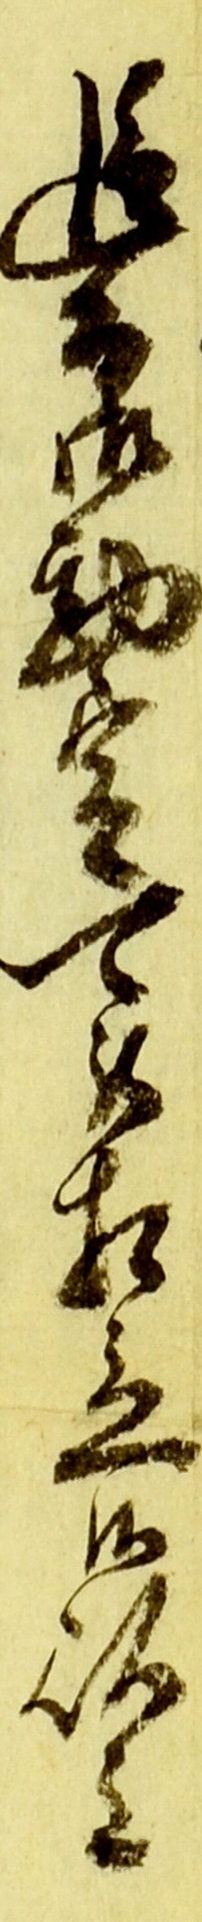追而御勘定可被相立候以上
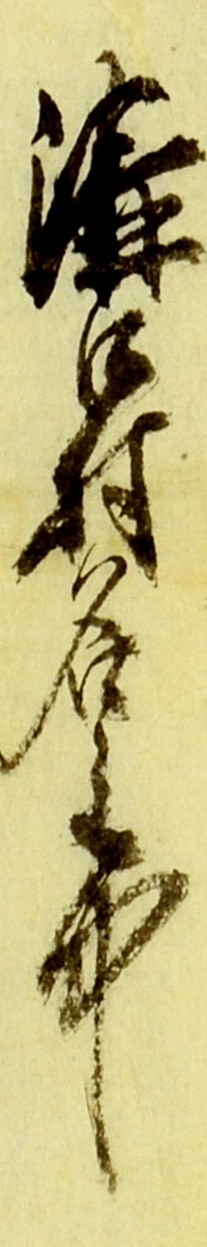溝口村名主中
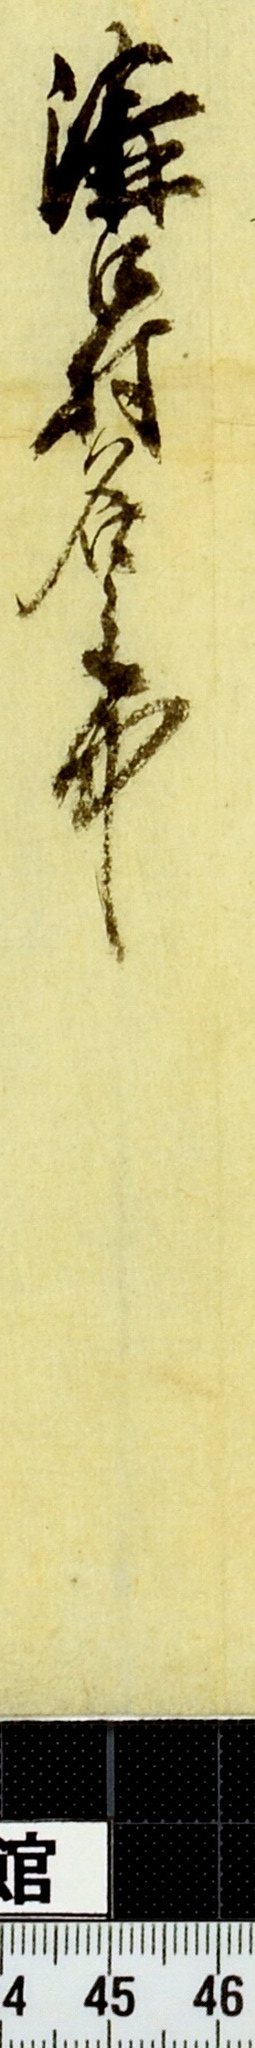溝口村名主中

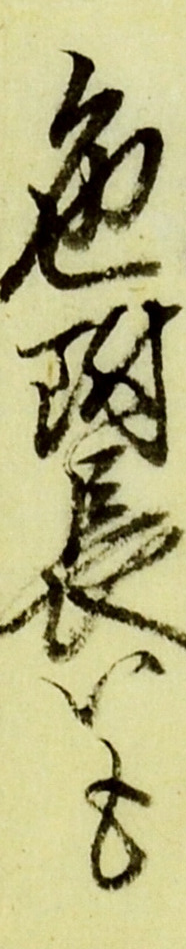色付長いも
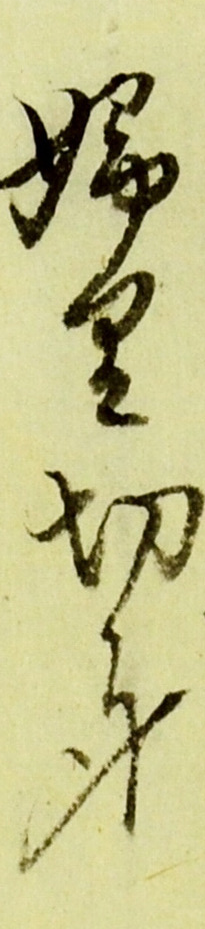ふり切身
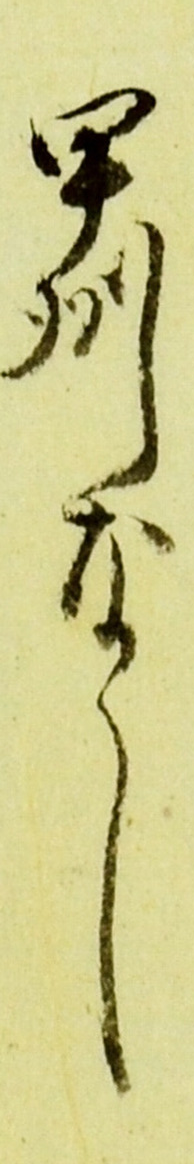甲州なし
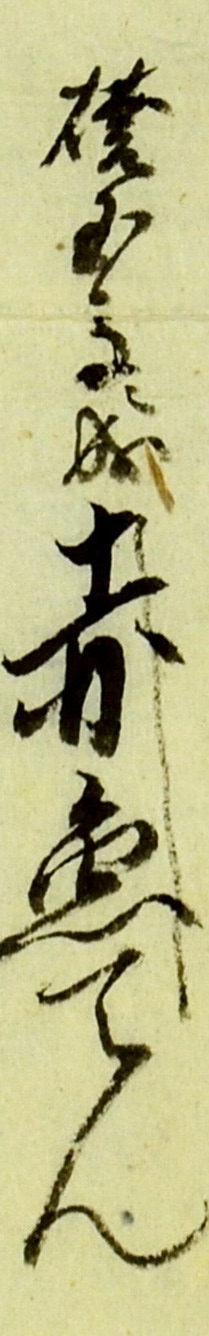焼玉子ニ成赤魚てん
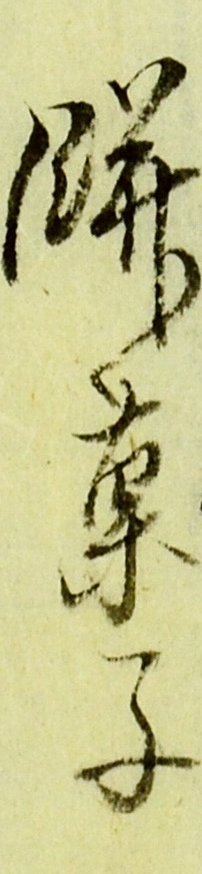餅菓子
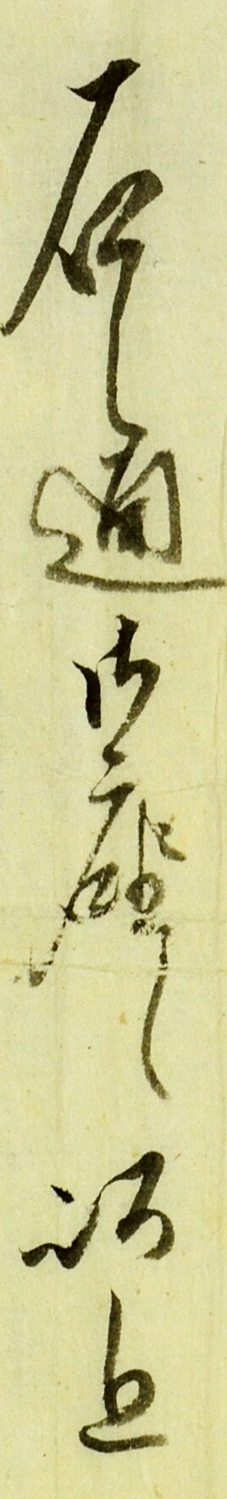右之通御座候以上
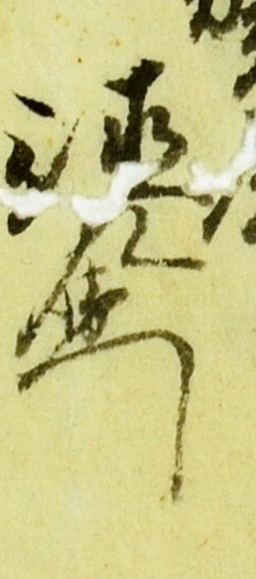徳左衛門
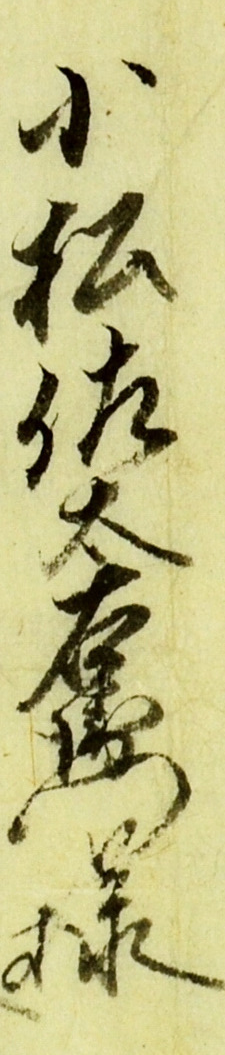小松佐太右衛門様
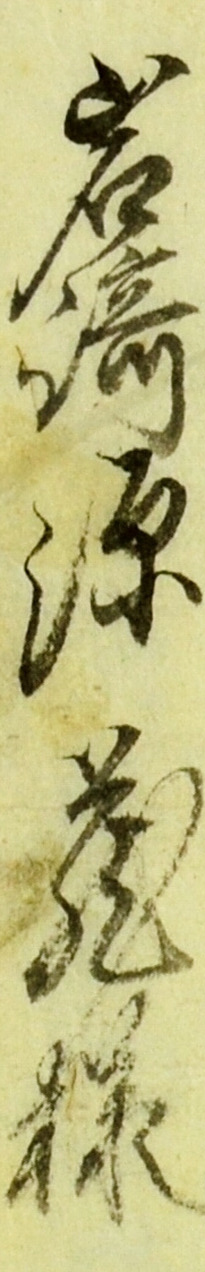岩﨑源蔵様

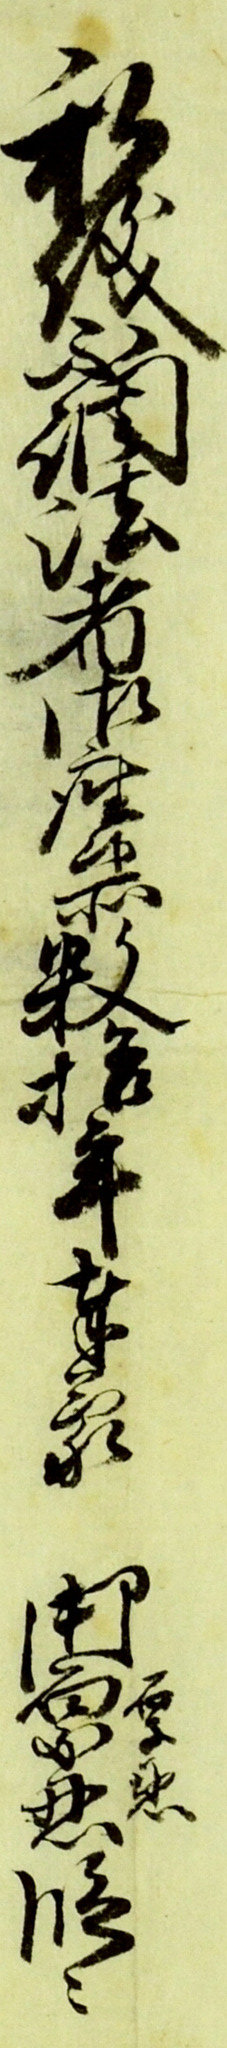私儀不調法者御座候所数拾年奉蒙御厚恩段々
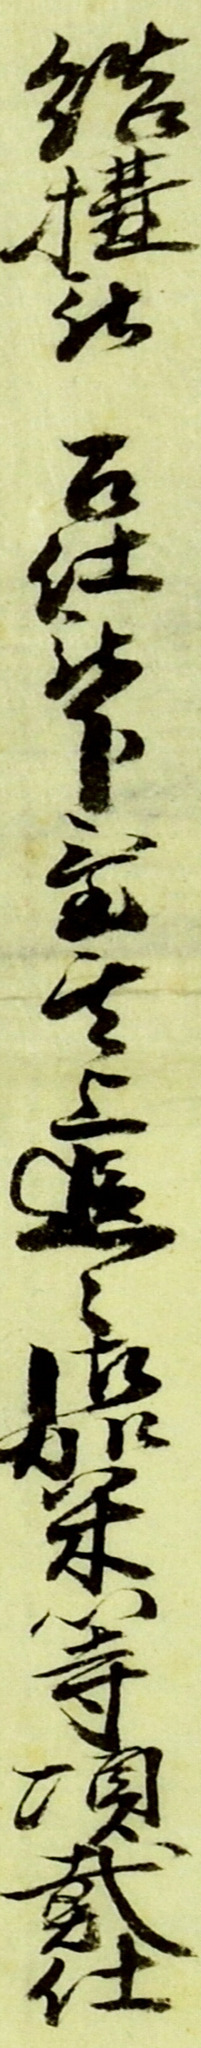結構被召仕被下置其上追々御加米等頂戴仕
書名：覚
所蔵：伊那市立高遠町図書館・合同会社AMANE
